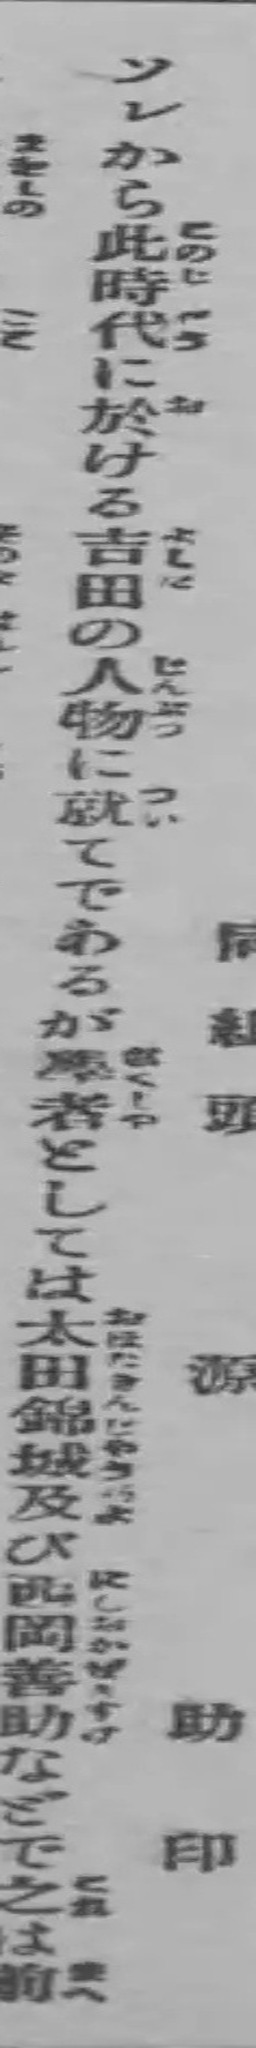ソレから此時代に於ける吉田の人物に就てであるが学者としては太田錦城及び西岡善助などで之は前
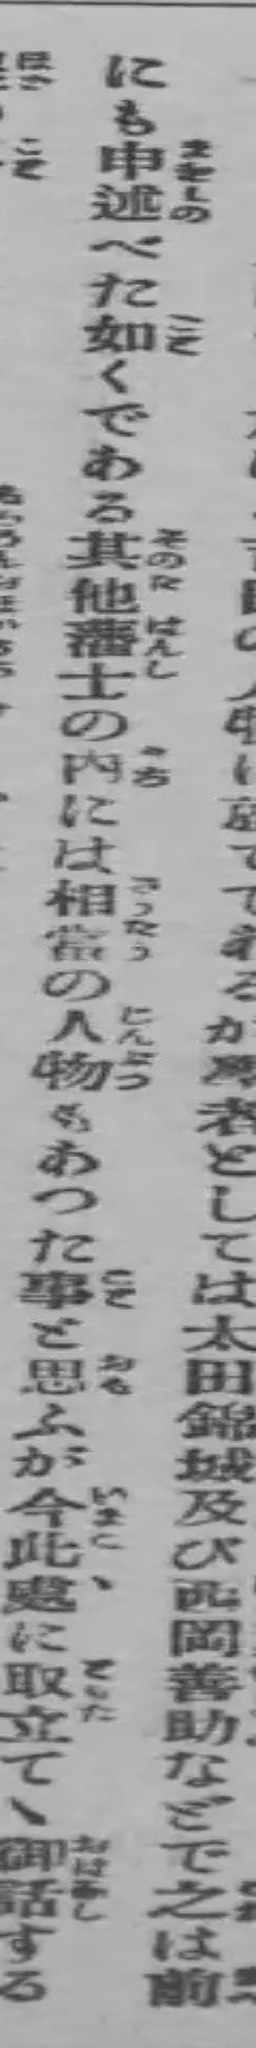にも申述べた如くである其他藩士の内には相当の人物もあつた事と思ふが今此処に取立てゝ御話する
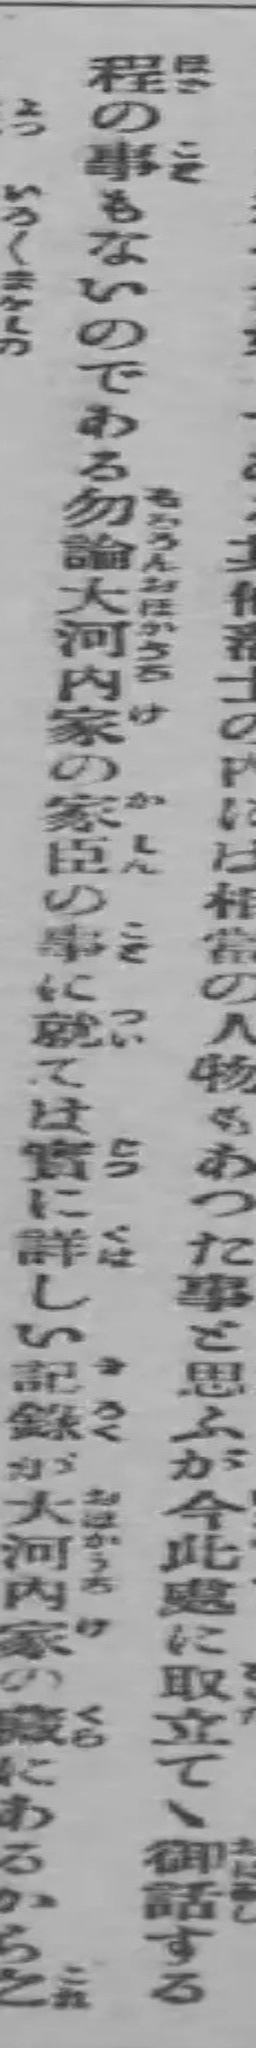程の事もないのである勿論大河内家の家臣の事に就ては実に詳しい記録が大河内家の蔵にあるから之
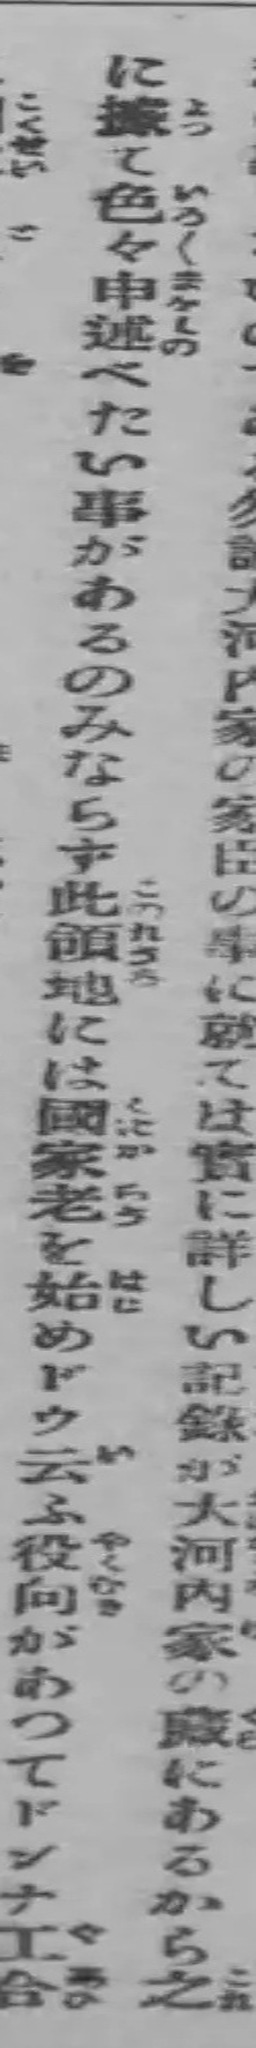に拠て色々申述べたい事があるのみならず此領地には国家老を始めドウ云ふ役向があつてドンナ工合
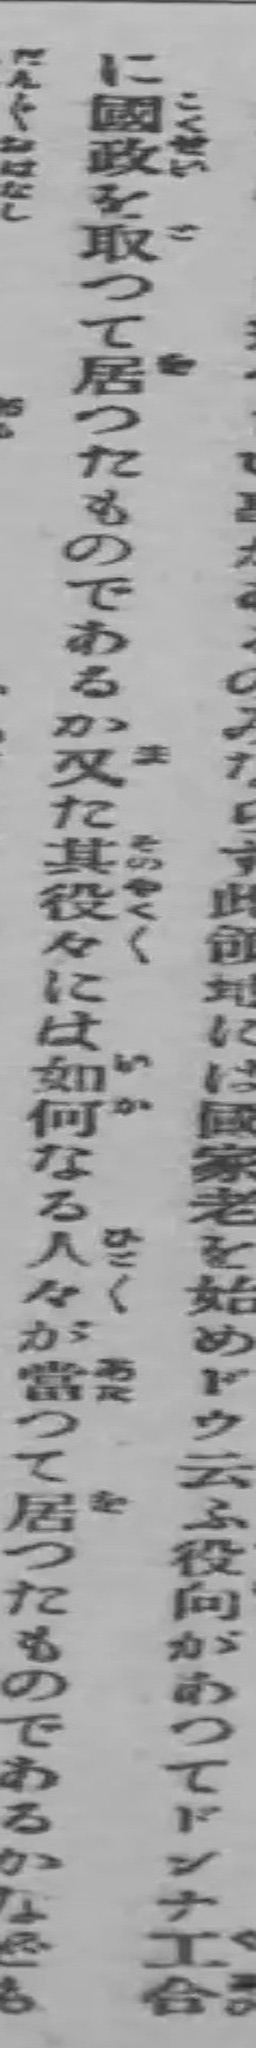に国政を取つて居つたものであるか又た其役々には如何なる人々が当つて居つたものであるかなども
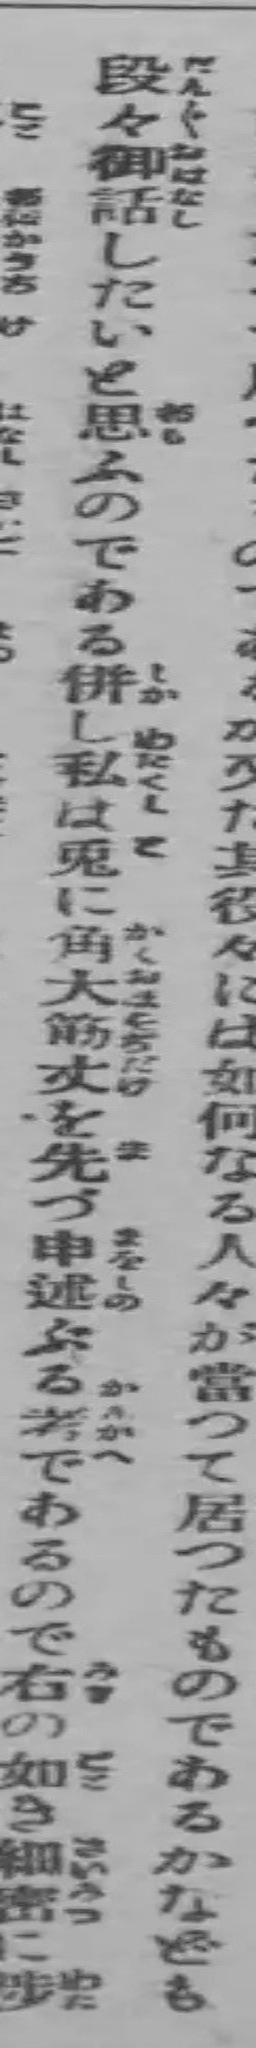段々御話したいと思ふのである併し私は兎に角大筋丈を先づ申述ぶる考であるので右の如き細密に渉
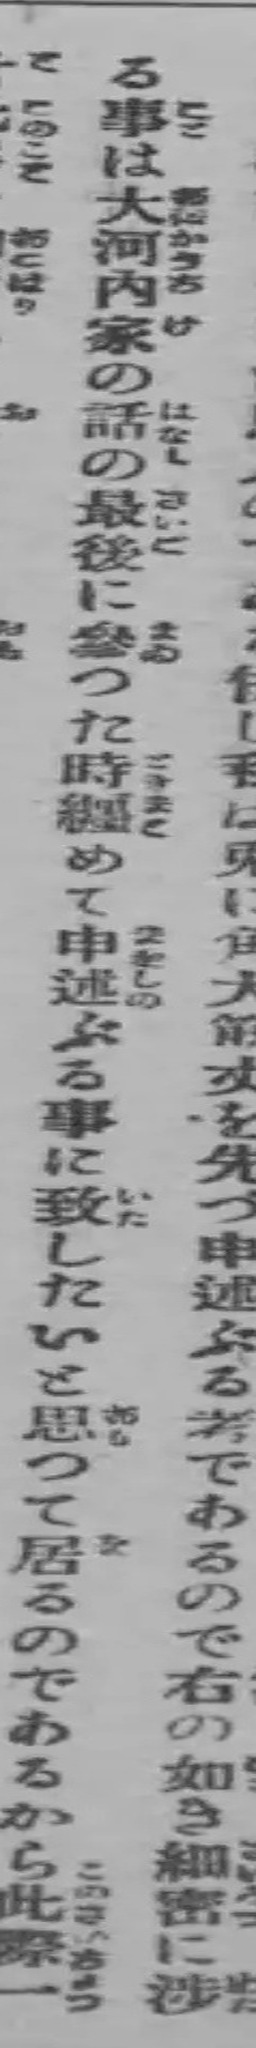る事は大河内家の話の最後に参つた時纏めて申述ぶる事に致したいと思つて居るのであるから此際一
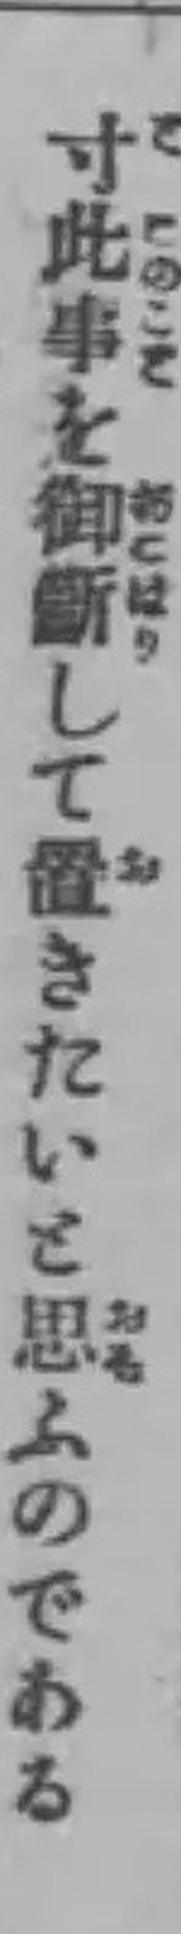寸此事を御断して置きたいと思ふのである
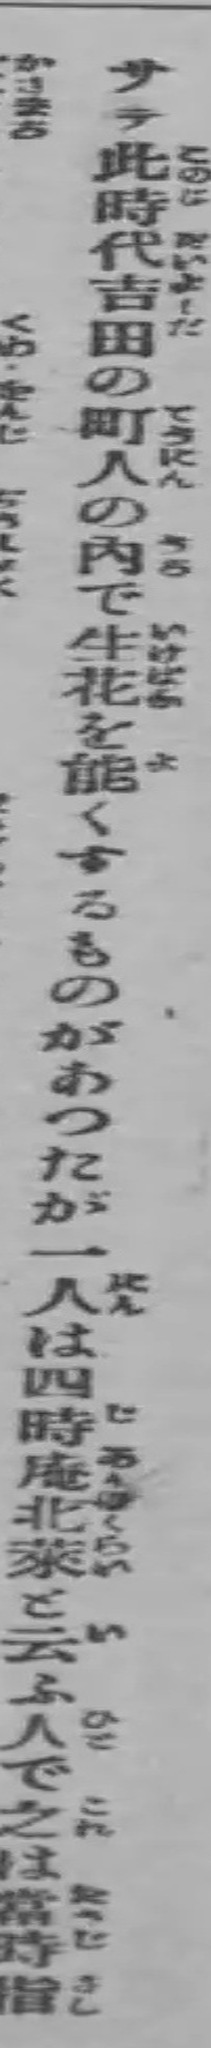サテ此時代吉田の町人の内で生花を能くするものがあつたが一人は四時庵北萊と云ふ人で之は当時指
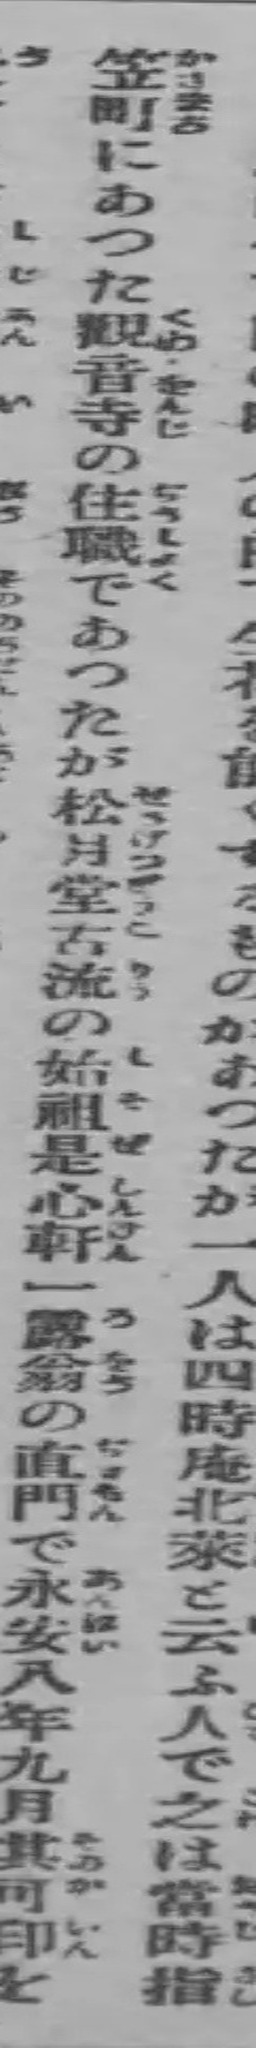四時庵北萊笠町にあつた観音寺の住職であつたが松月堂古流の始祖是心軒一露翁の直門で安永八年九月其可印を
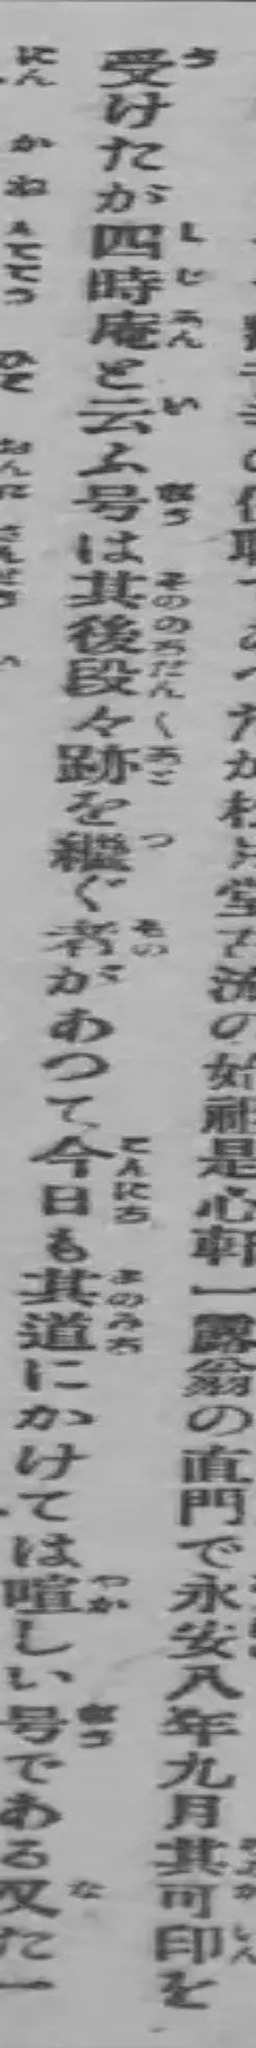受けたが四時庵と云ふ号は其後段々跡を継ぐ者があつて今日も其道にかけては喧しい号である又た一
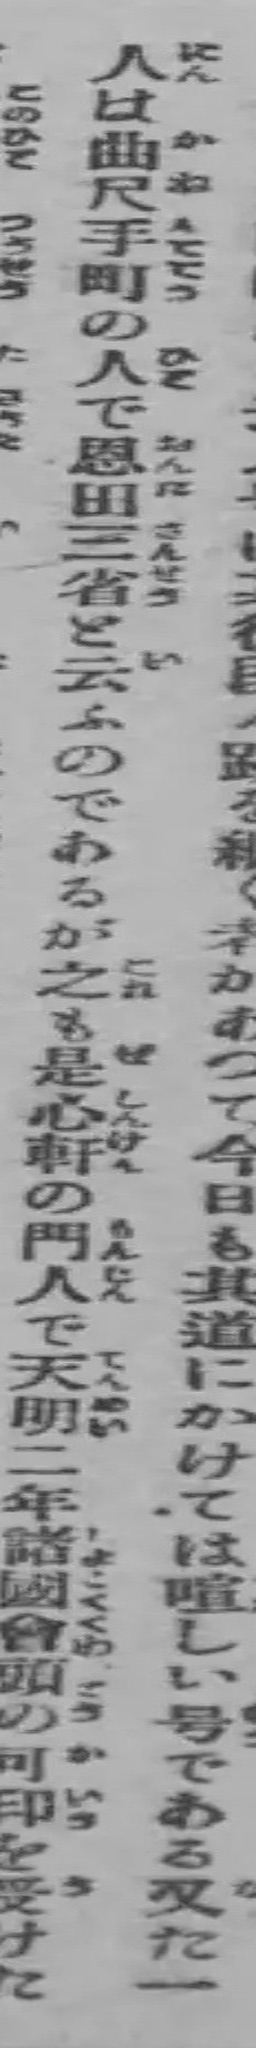恩田三省人は曲尺手町の人で恩田三省と云ふのであるが之も是心軒の門人で天明二年諸国会頭の可印を受けた
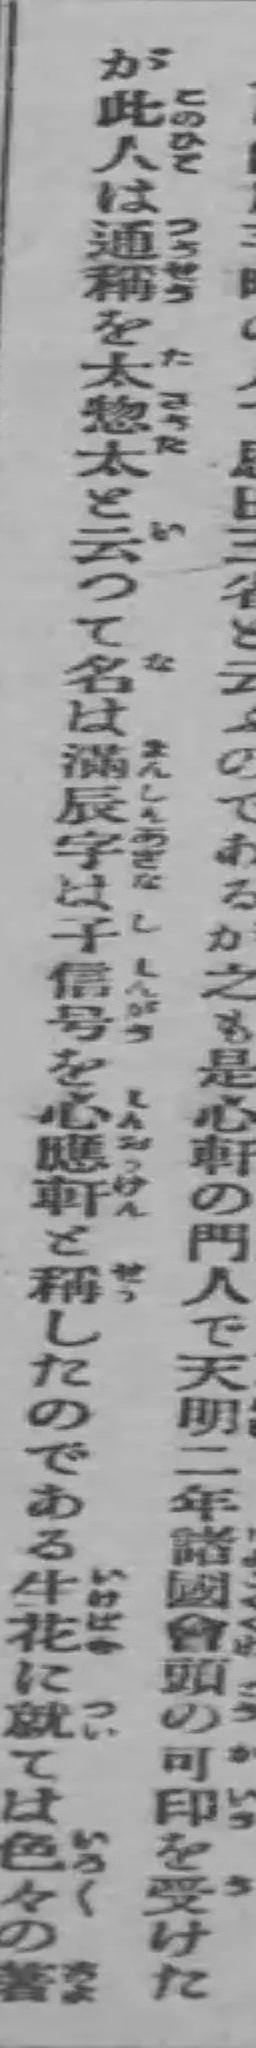が此人は通称を太惣太と云つて名は満辰字は子信号を心応軒と称したのである生花に就ては色々の著
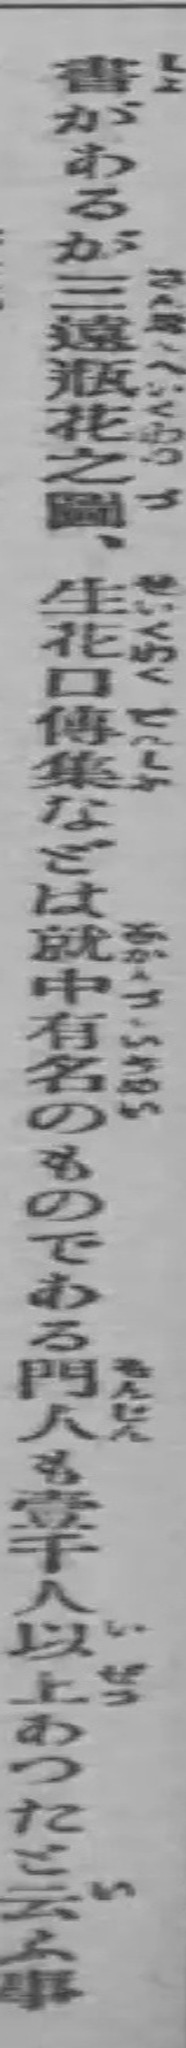書があるが三遠瓶花之図、生花口伝集などは就中有名のものである門人も壱千人以上あつたと云ふ事
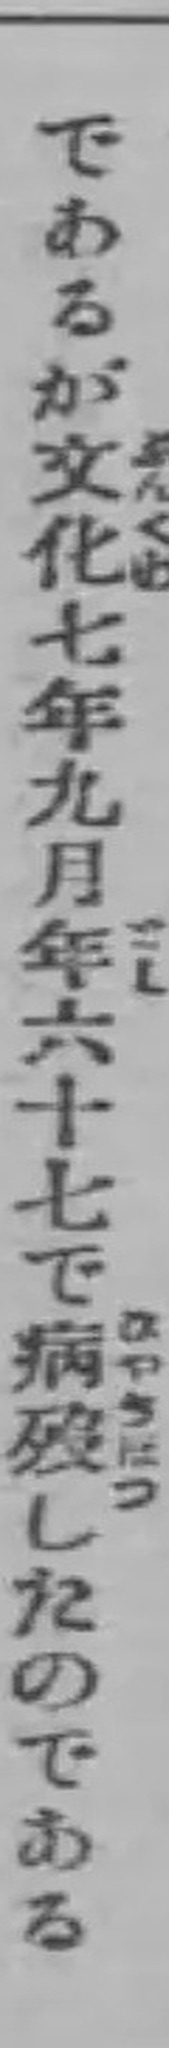であるが文化七年九月年六十七で病歿したのである
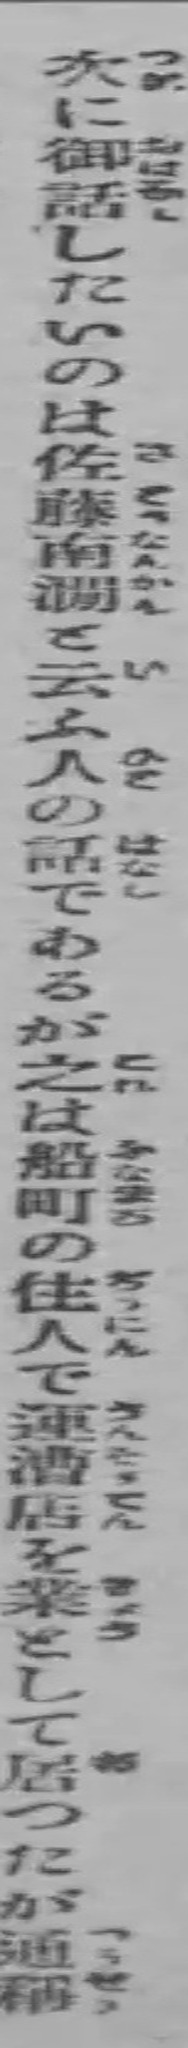佐藤南澗次に御話したいのは佐藤南澗と云ふ人の話であるが之は船町の住人で運漕店を業として居つたが通称
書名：豊橋市史談
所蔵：国立国会図書館 National Diet Library, JAPAN
